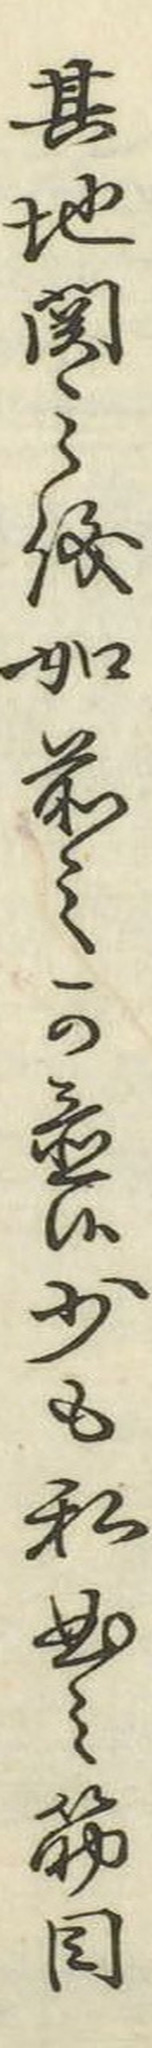其地関之儀如前之可置候少も私曲之筋目
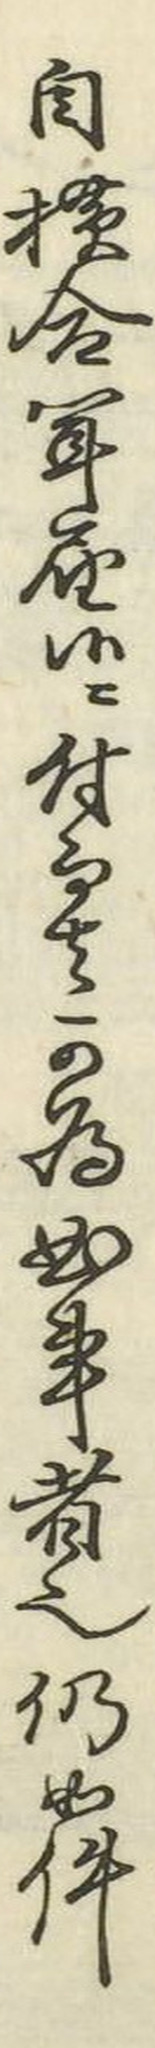自横合聞届候に付而其可為曲事者也仍如件
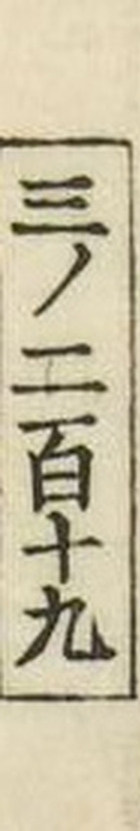三ノ二百十九
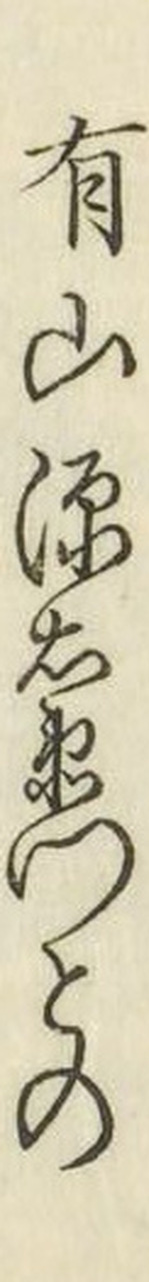有山源右衛門との
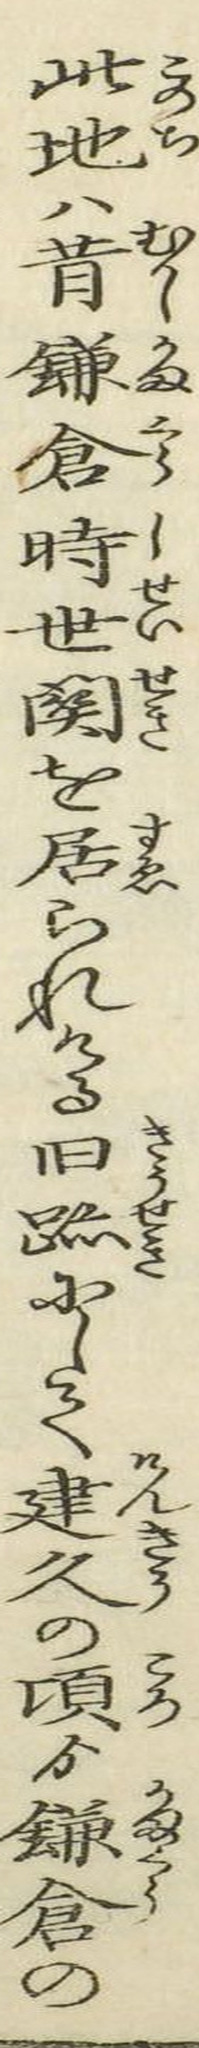此地は昔鎌倉時世関を居られける旧跡にして建久の頃ゟ鎌倉の
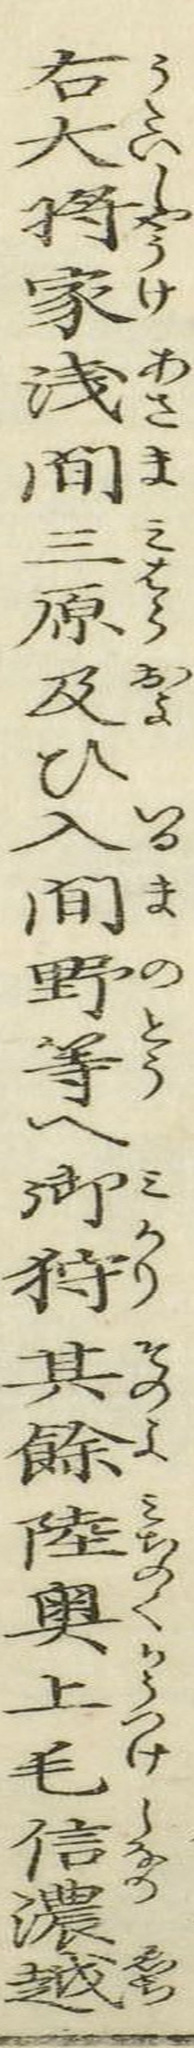右大将家浅間三原及ひ入間野等へ御狩其余陸奥上毛信濃越
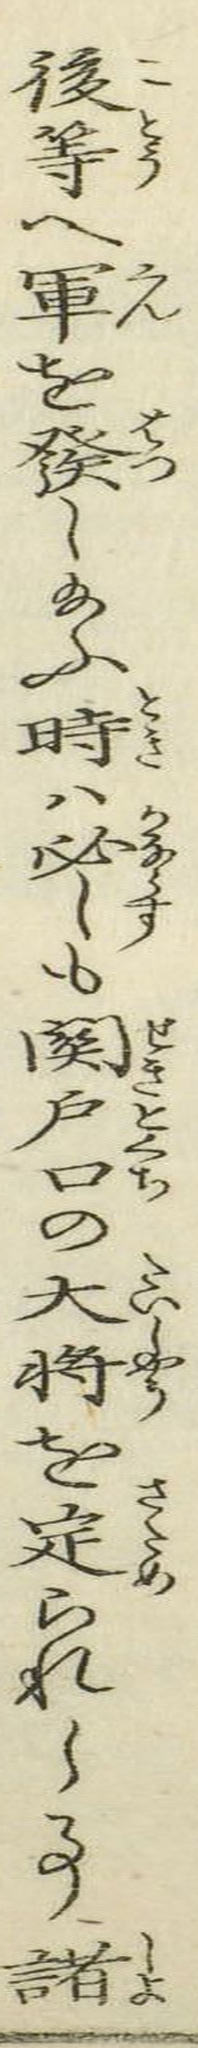後等へ軍を発し給ふ時は必しも関戸口の大将を定られし事諸
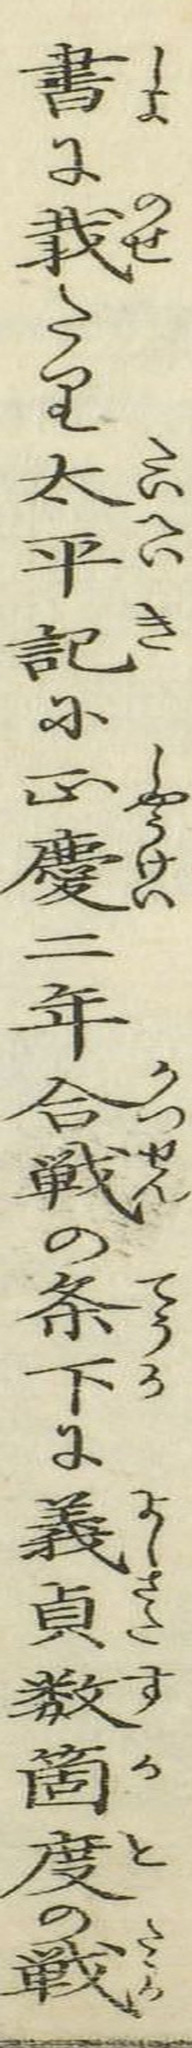書の載たり太平記に正慶二年合戦の条下に義貞数箇度の戦
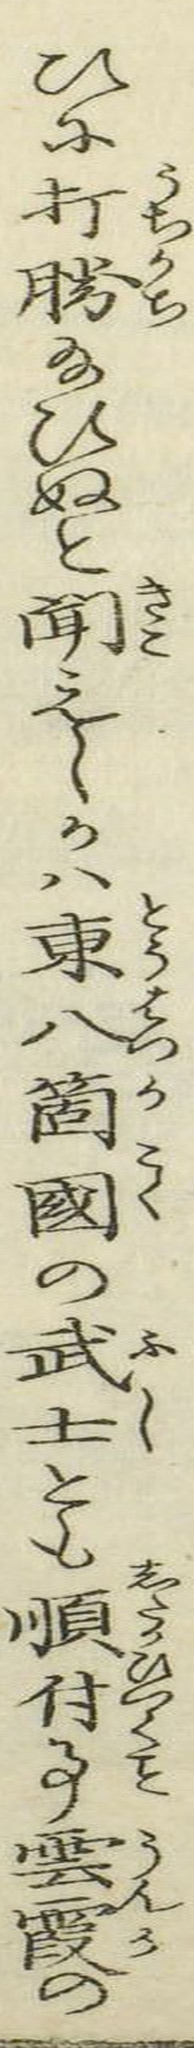ひに打勝給ひぬと聞えしかは東八箇国の武士とも順付事雲霞の
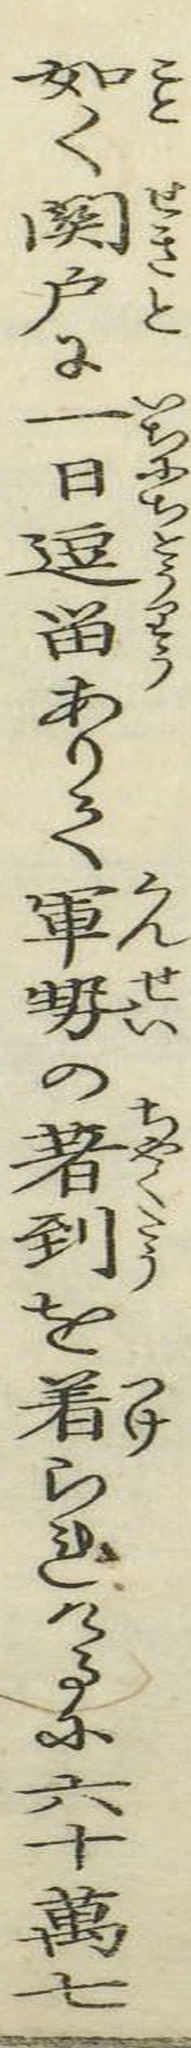如く関戸に一日逗留ありて軍勢の著到を着られけるに六十萬七
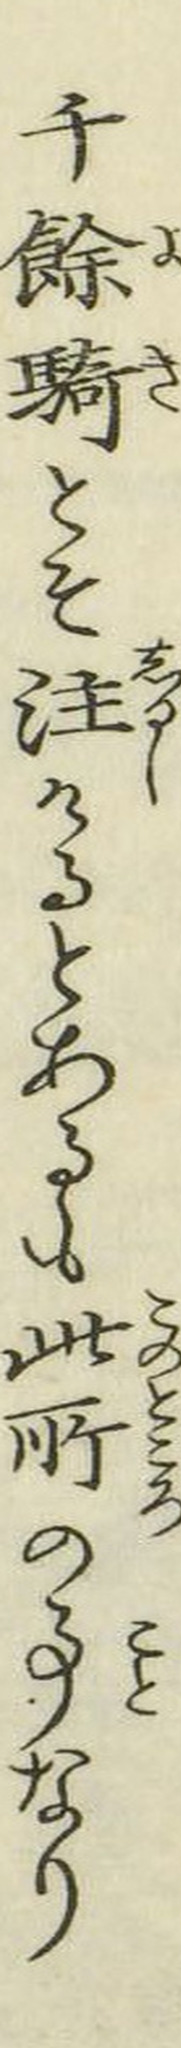千余騎とそ注けるとあるも此所の事なり
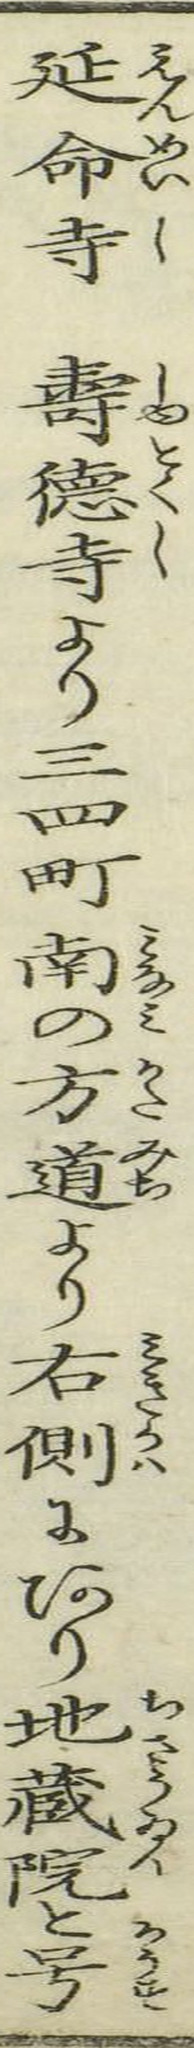延命寺寿徳寺より三四町南の方道より右側にあり地蔵院と号
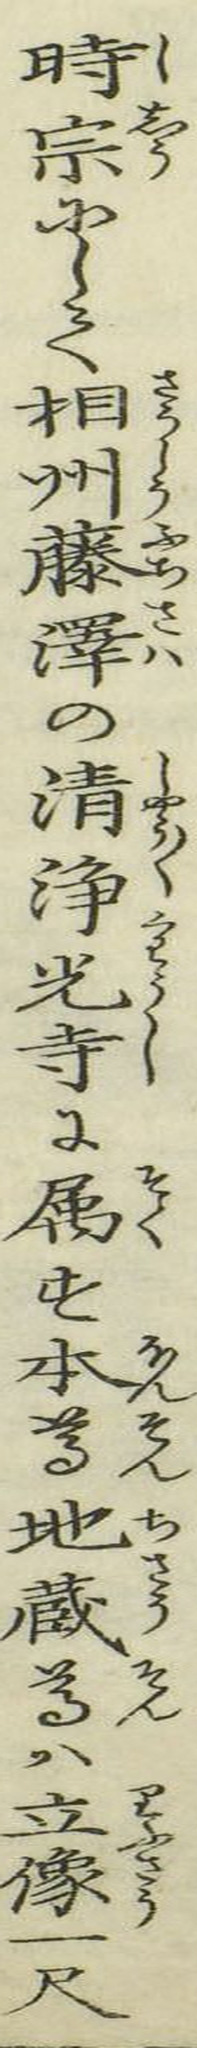時宗にして相州藤沢の清浄光寺に属す本尊地蔵尊は立像一尺
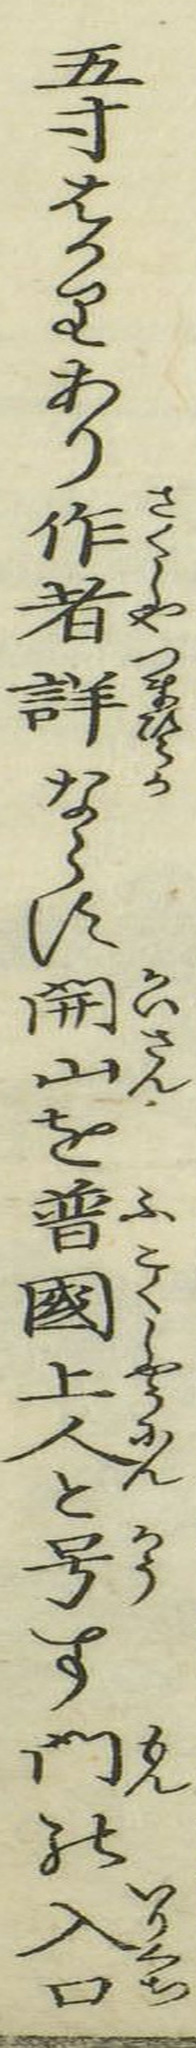五寸はかりあり作者詳ならす開山を普国上人と号す門の入口

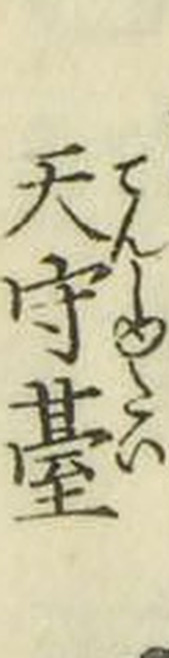天守台
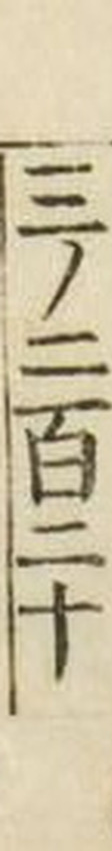三ノ二百二十
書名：江戸名所図会 20巻 巻之10
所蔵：東京学芸大学教育コンテンツアーカイブ
